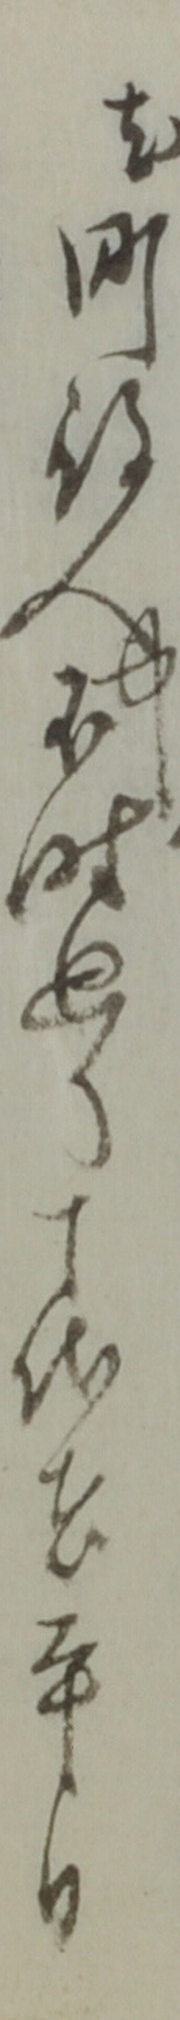尤町役人不時廻リ丁代者平日
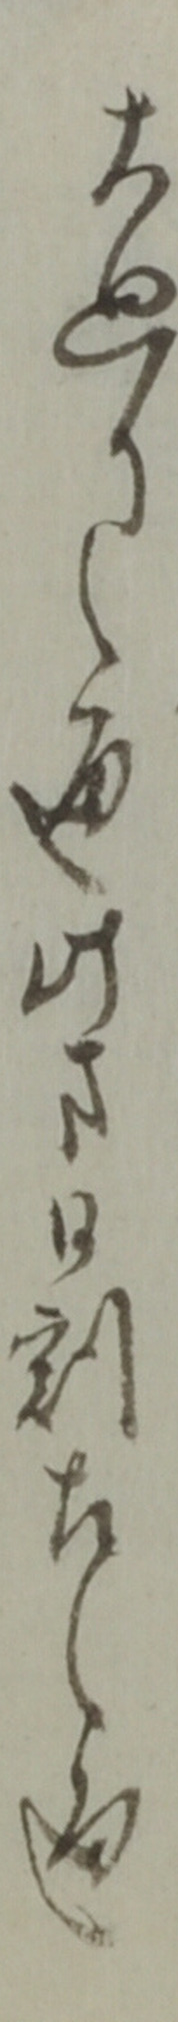大廻リ之通此方日割左之通
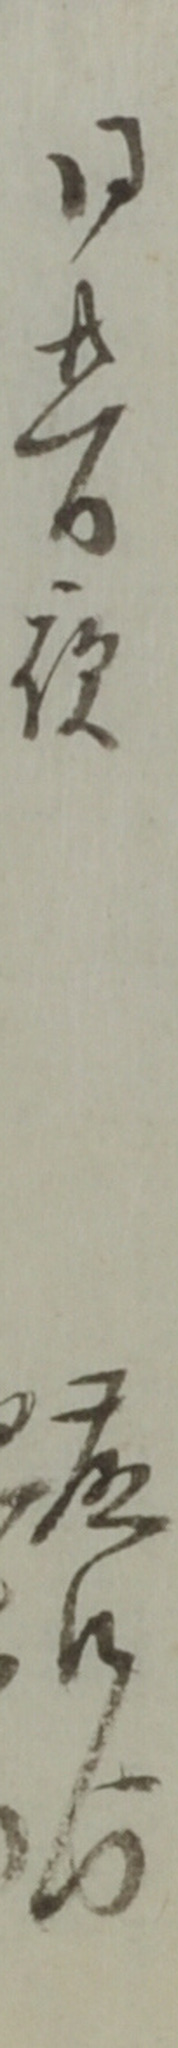同廿一日夜藤左衛門
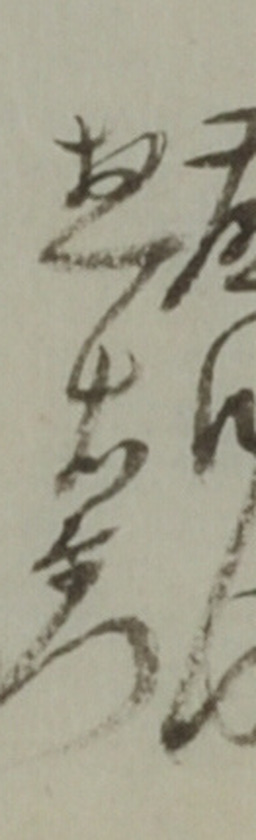惣右衛門
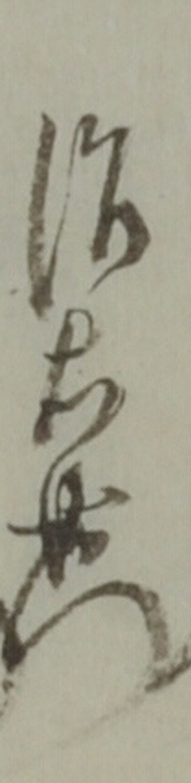惣右衛門
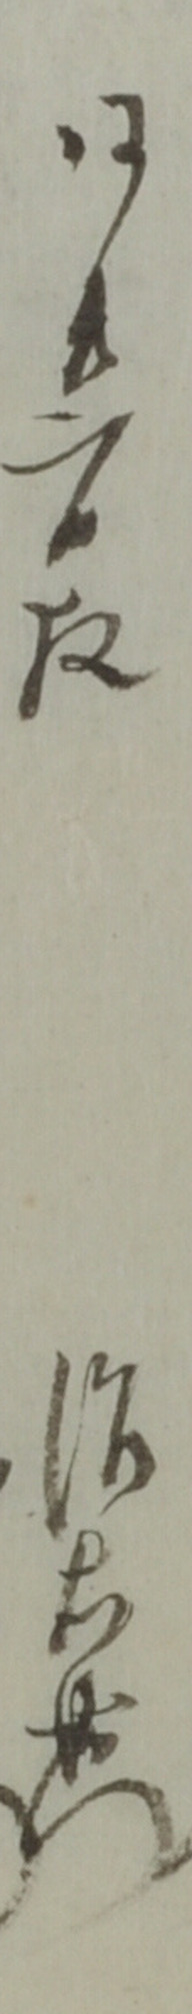同廿二日夜治右衛門
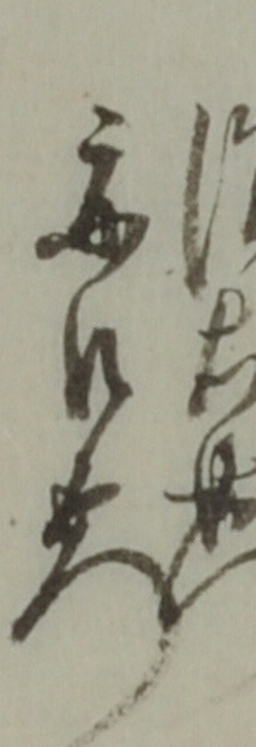亦左衛門
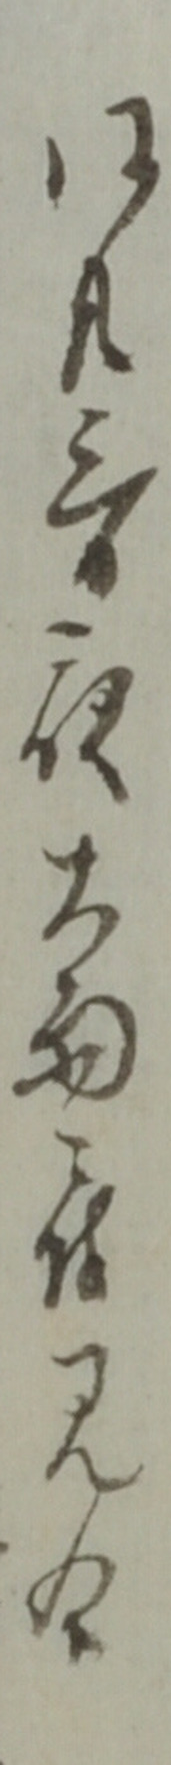同廿三日夜大雨ニ付見合
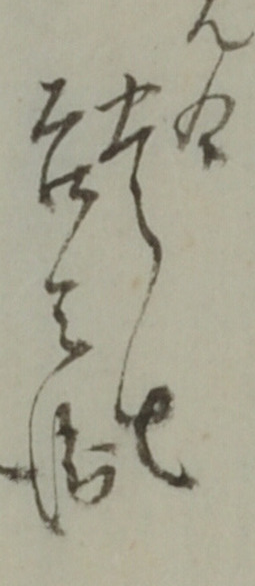吉兵衛
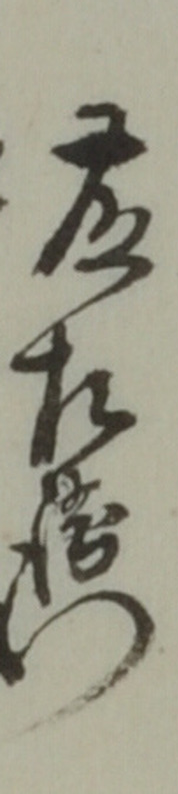亦左衛門
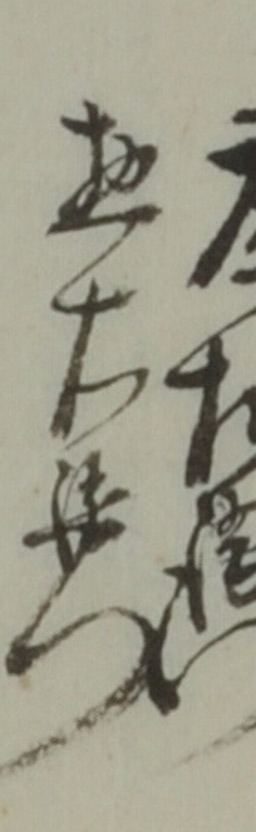惣右衛門
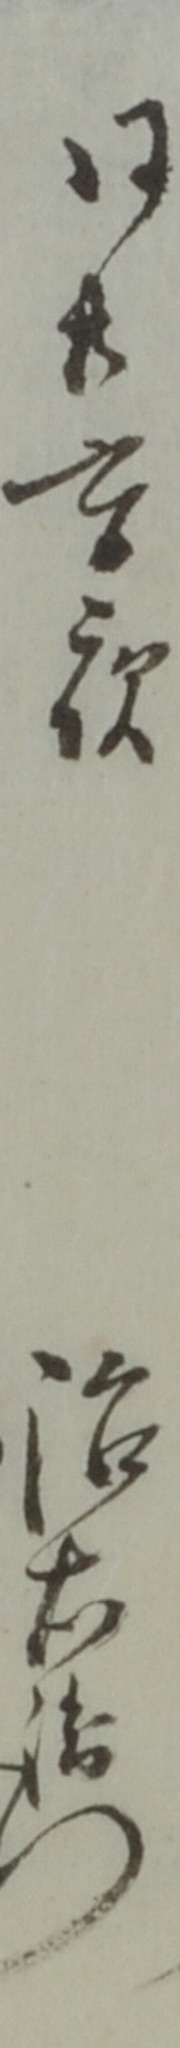同廿六日夜治右衛門
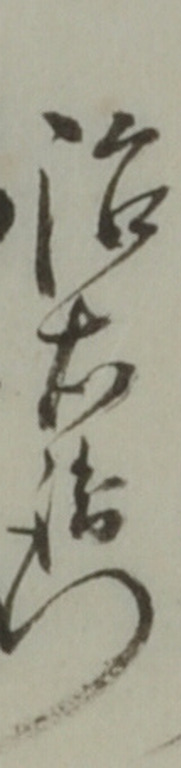惣右衛門
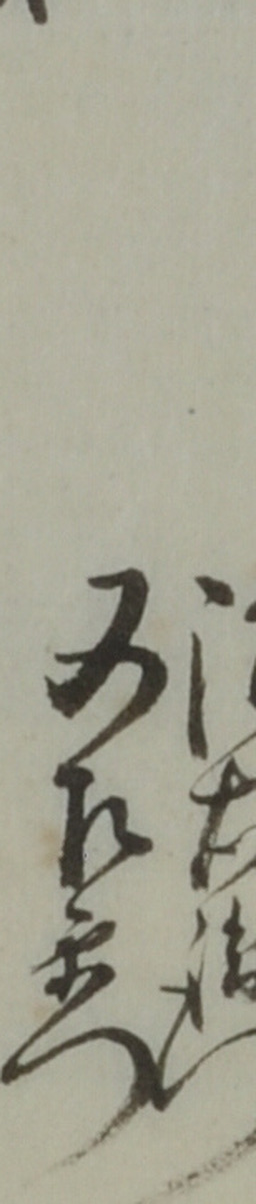又左衛門
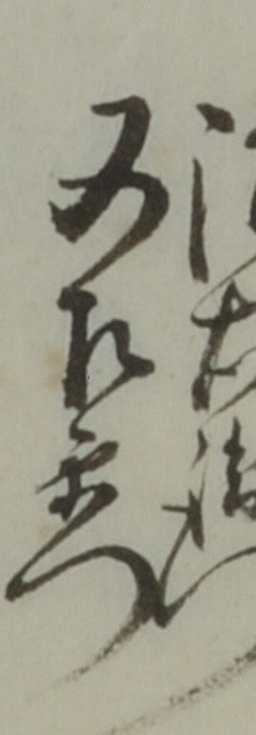又左衛門
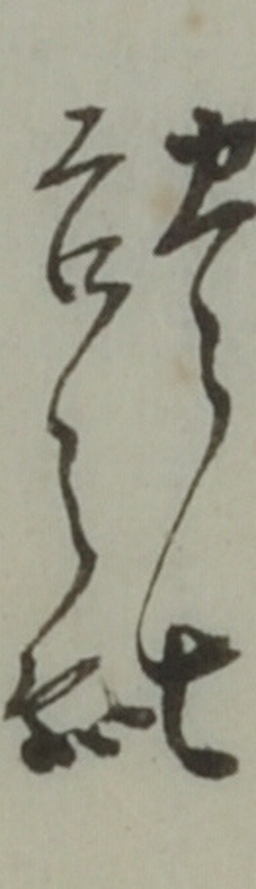吉兵衛
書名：日光御参詣ニ付町方警固番割名前控
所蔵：伊那市立高遠町図書館・合同会社AMANE
